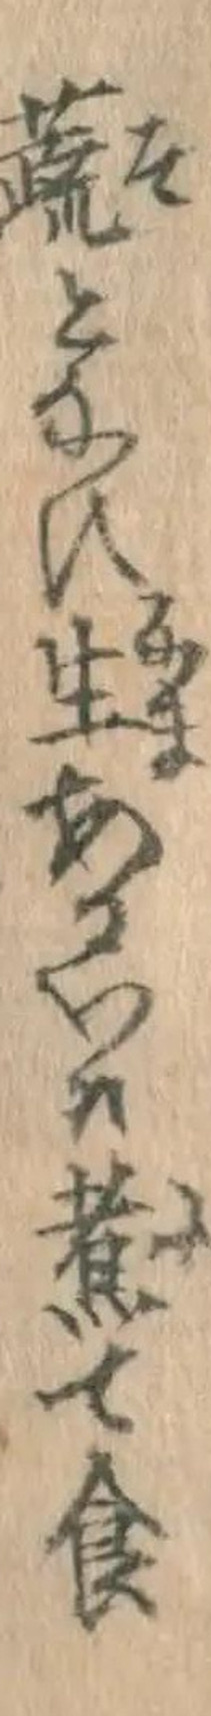蔬となす生あるいは煮て食
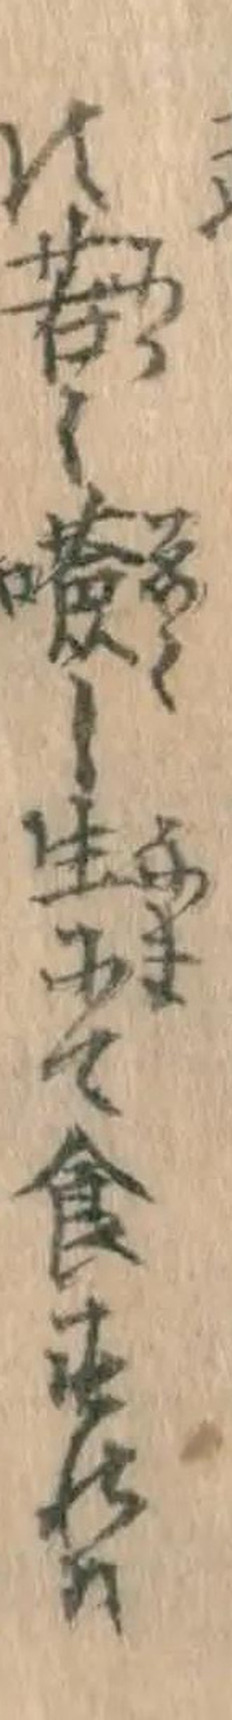す苦くし生にて食すれは
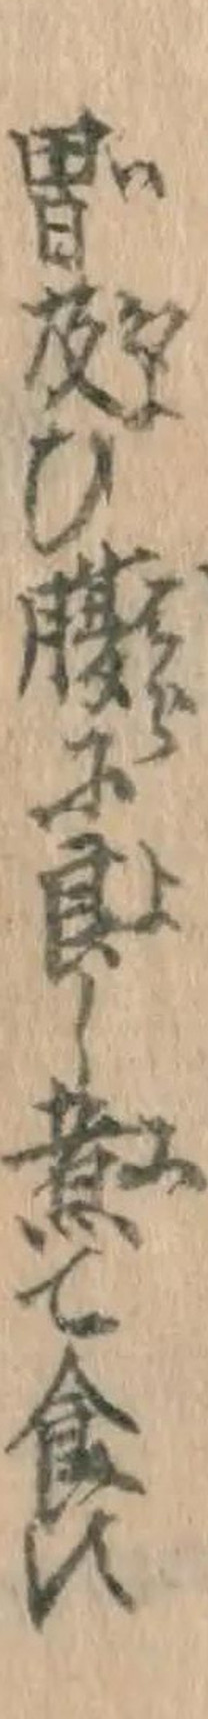胃及ひ腹に良し煮て食す

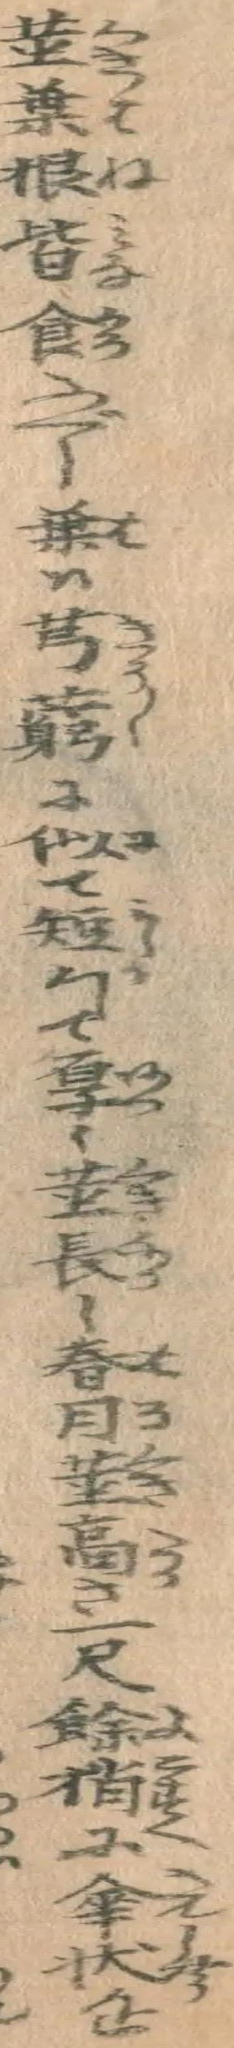茎葉根皆食ふべし葉は芎藭に似て短くして厚く茎長し春月茎高さ一尺余梢に傘状を
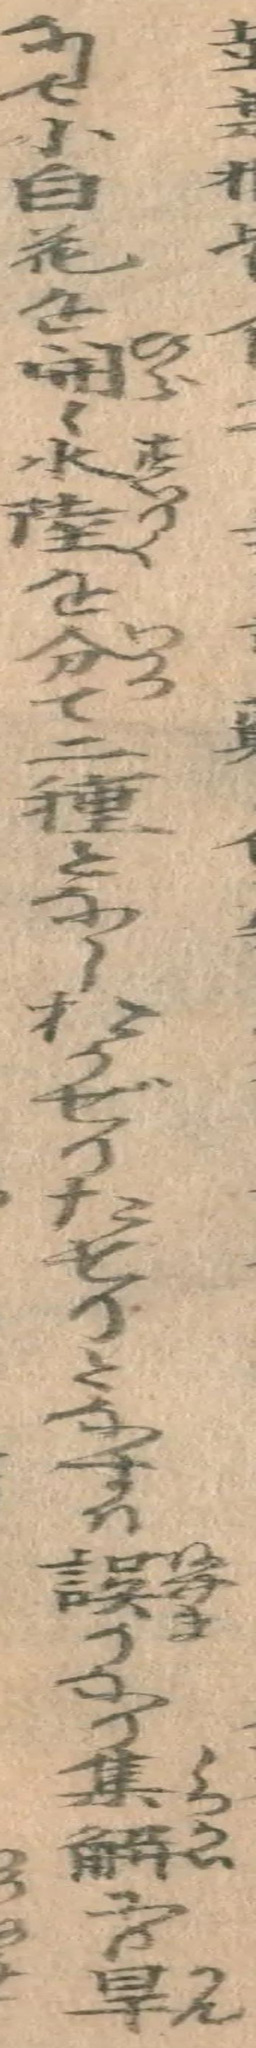なして小白花を開く水陸を分て二種となしおうぜりたせりとなすは誤りなり集解にも旱
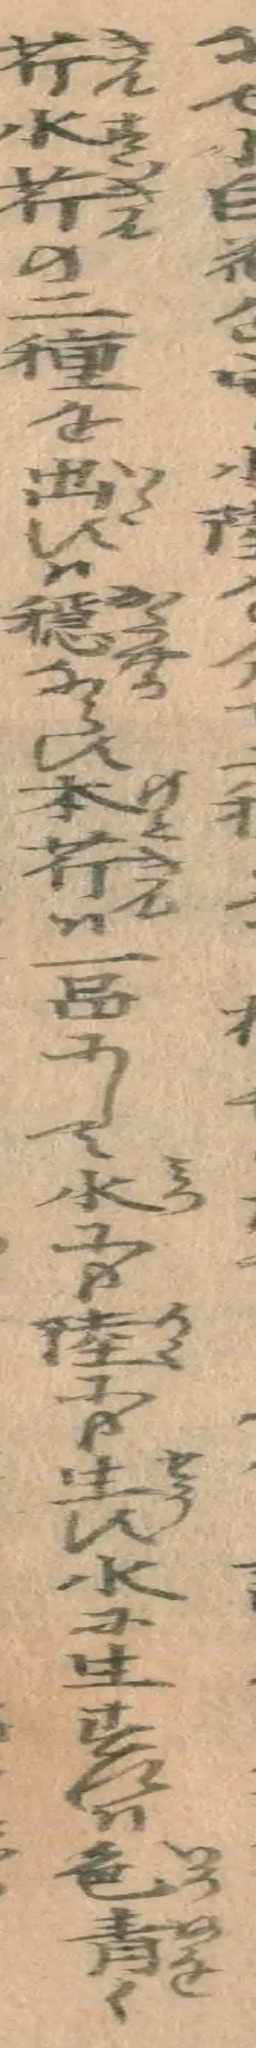芹水芹の二種を出すは穏ならす本芹は一品にして水にも陸にも生す水に生すれは色青く
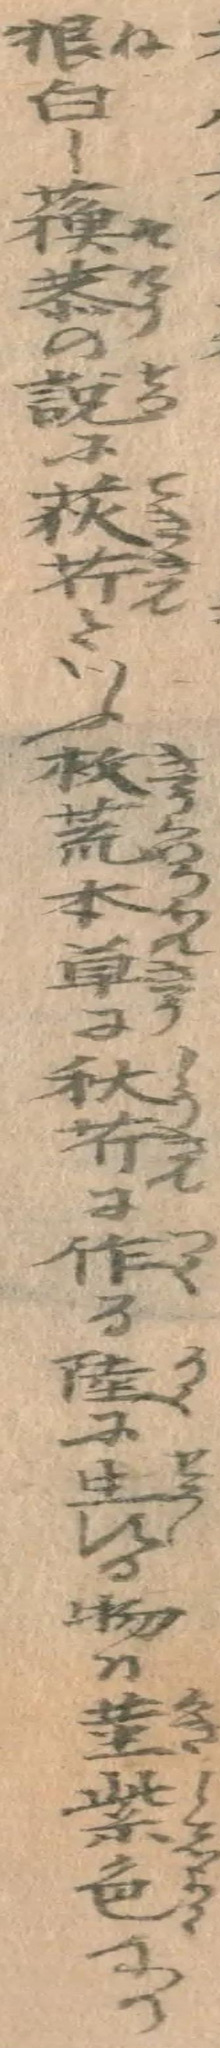根白し蘇恭の説に荻芹といふ救荒本草に秋芹に作る陸に生する物は茎紫色なり
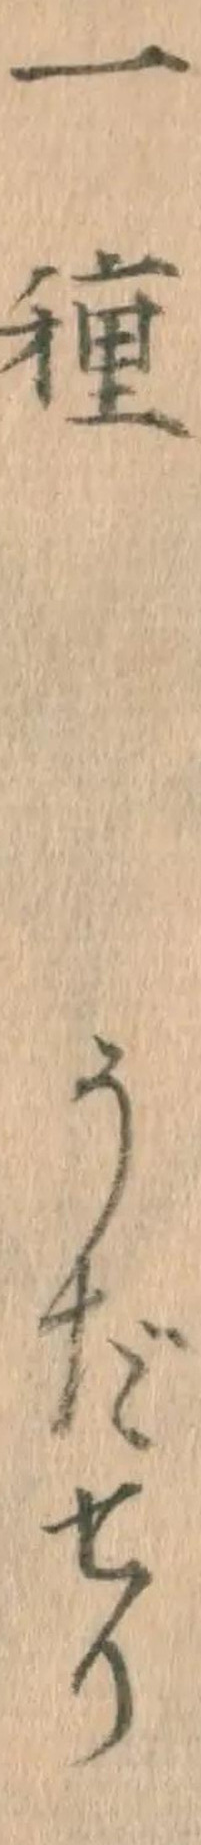一種うだせり
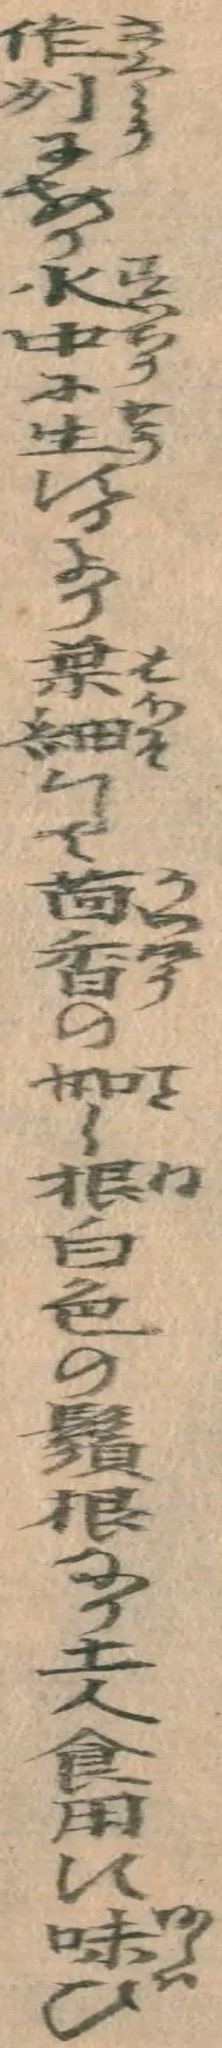作州にあり水中に生するより葉細くして茴香の如し根白色の鬚根なり土人食用す味ひ
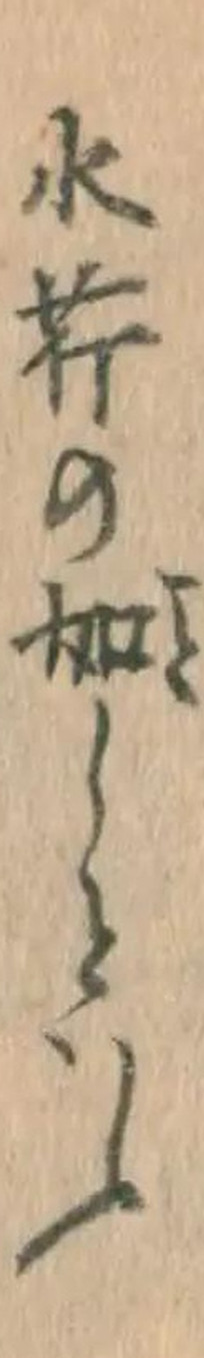水芹の如しといふ
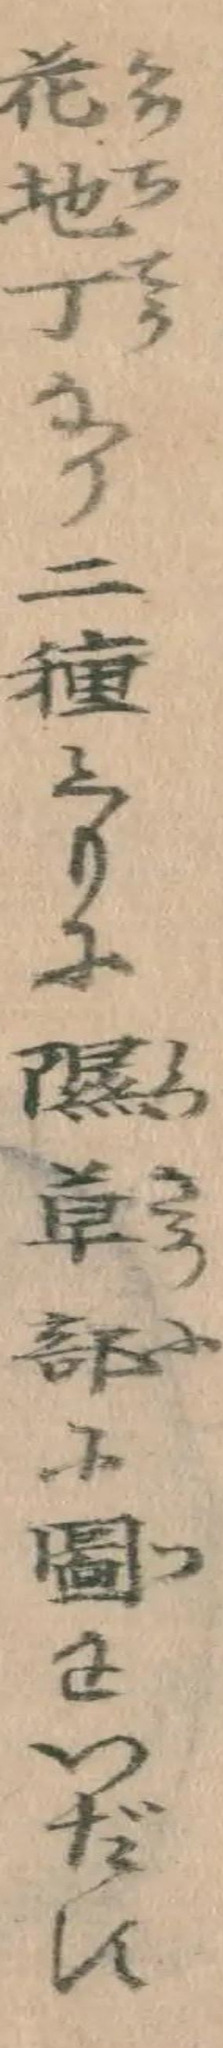花地丁なり二種ともに隰草部に図をいだす
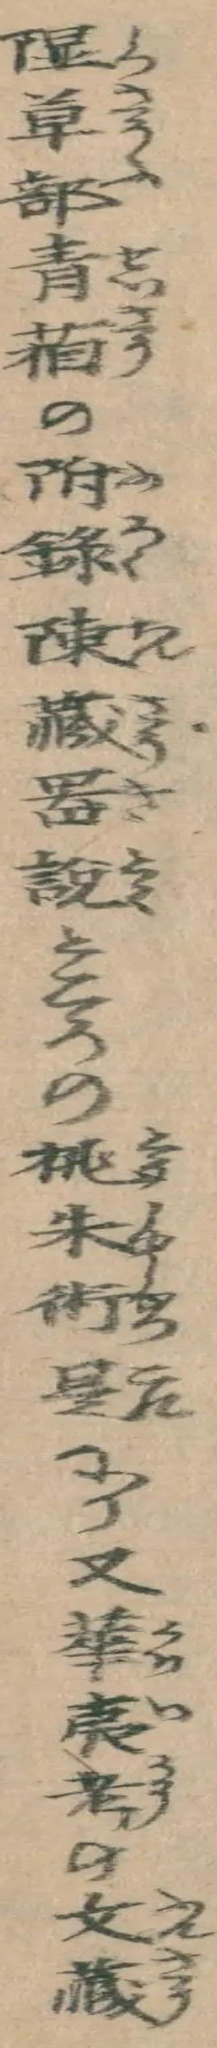隰草部青葙の附録陳蔵器説ところの桃朱術是なり又華夷老の文蔵

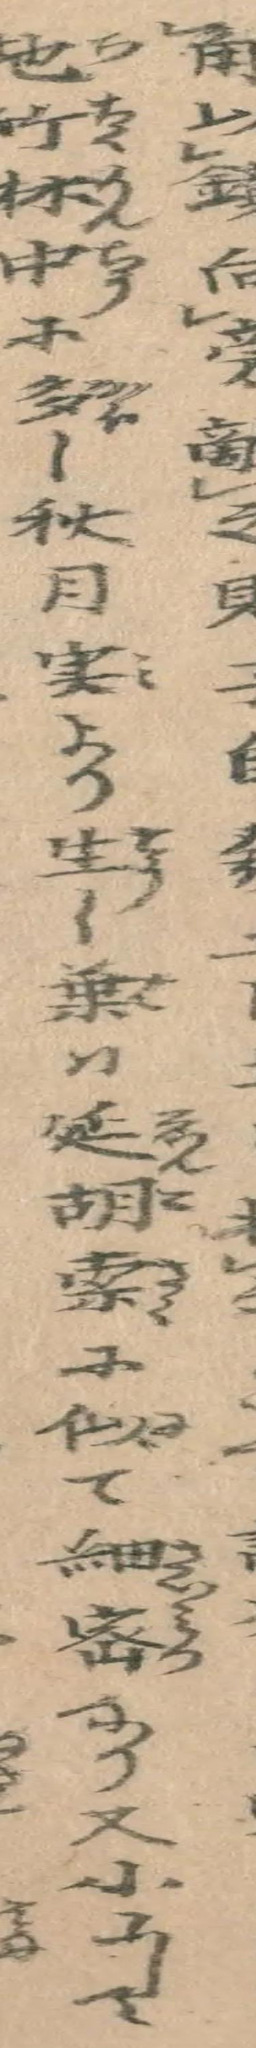地竹林中に多し秋月実より生し葉は延胡索に似て細密なり又小にして
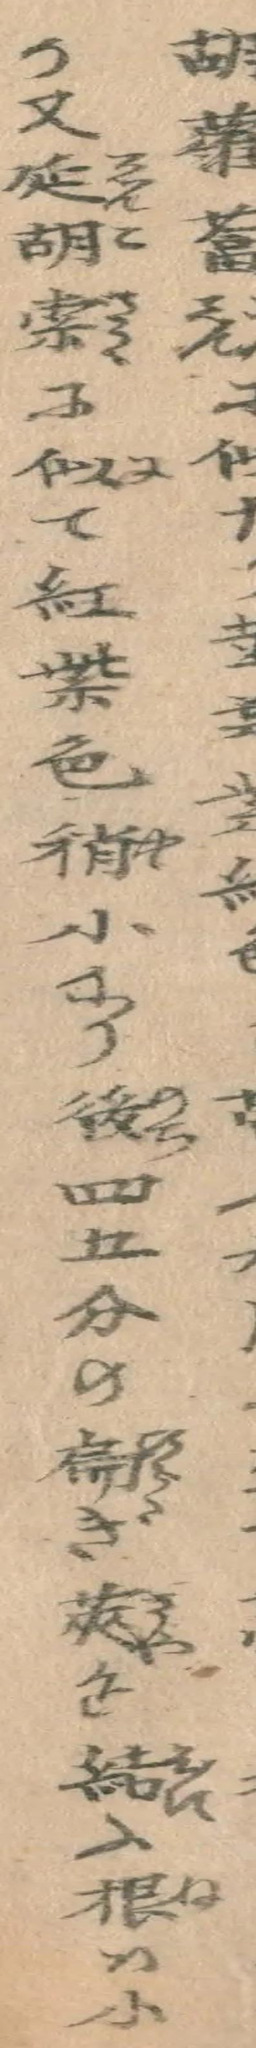り又延胡索に似て紅紫色稍小なり後四五分の扁き莢を結ふ根は小
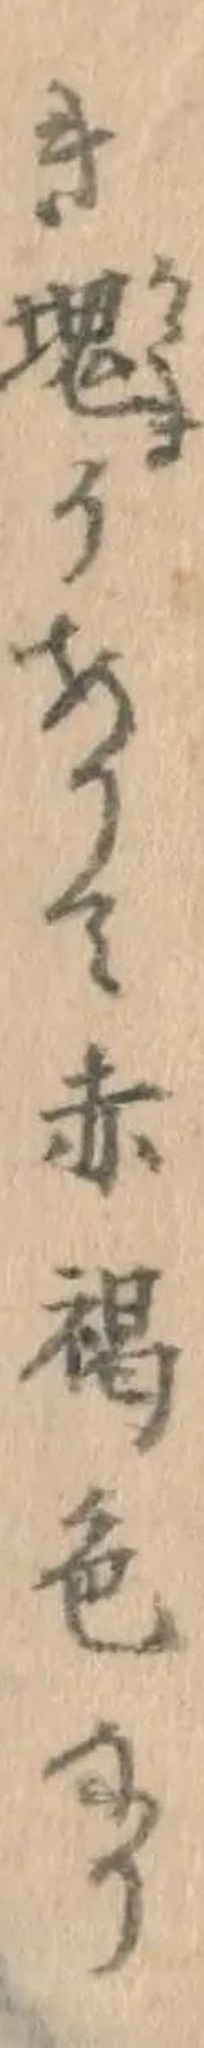き塊りありて赤褐色なり
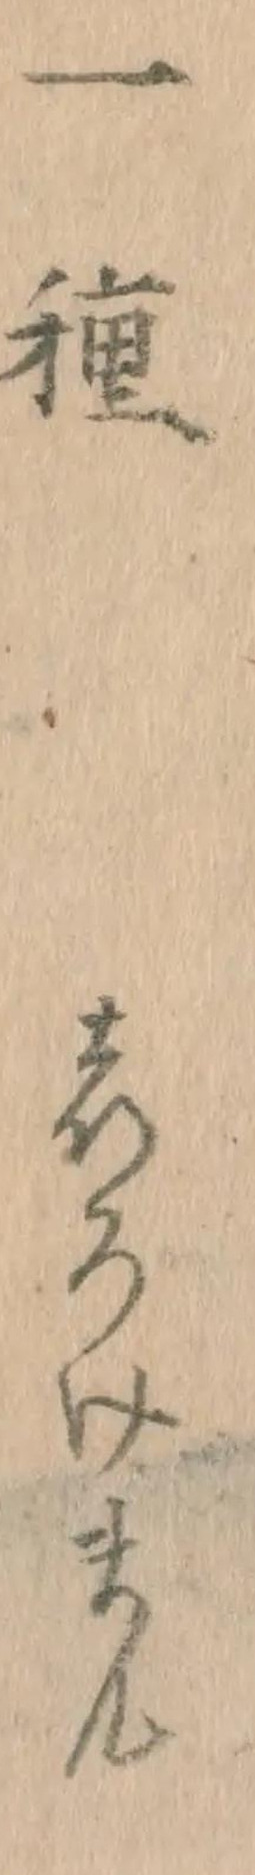一種しろけまん
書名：本草図譜. 巻46-48
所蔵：国立国会図書館 National Diet Library, JAPAN
